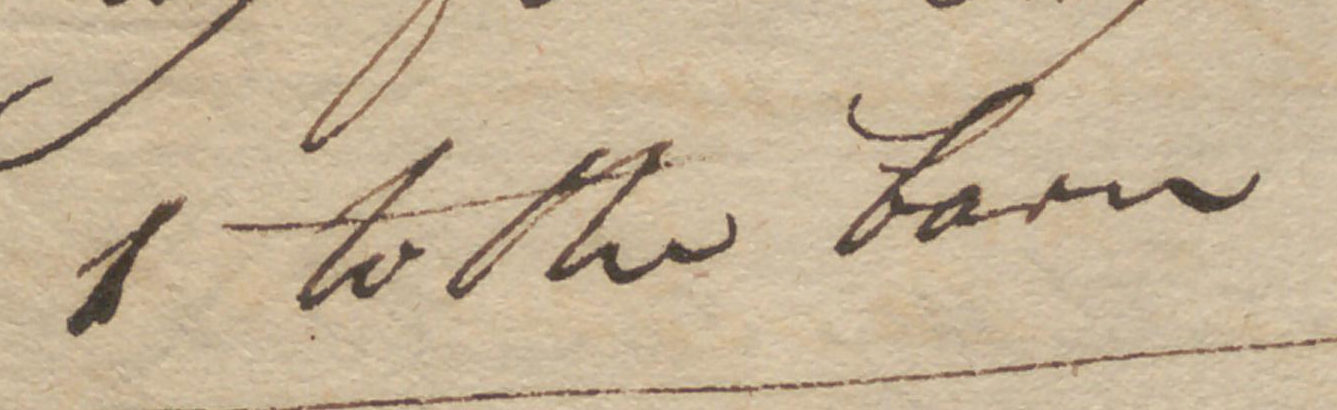1 to the barn
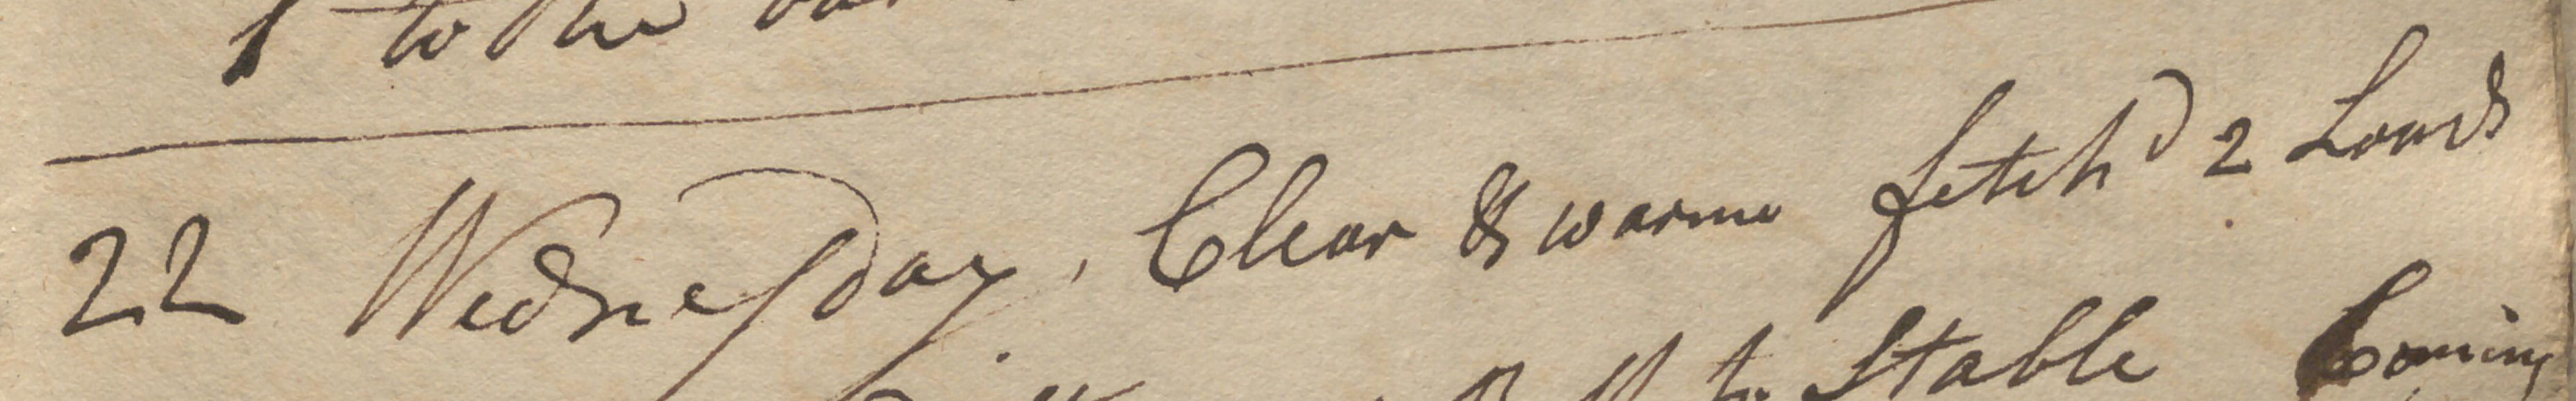2 Wednesday, Clear & warm fetch^d 2 Land
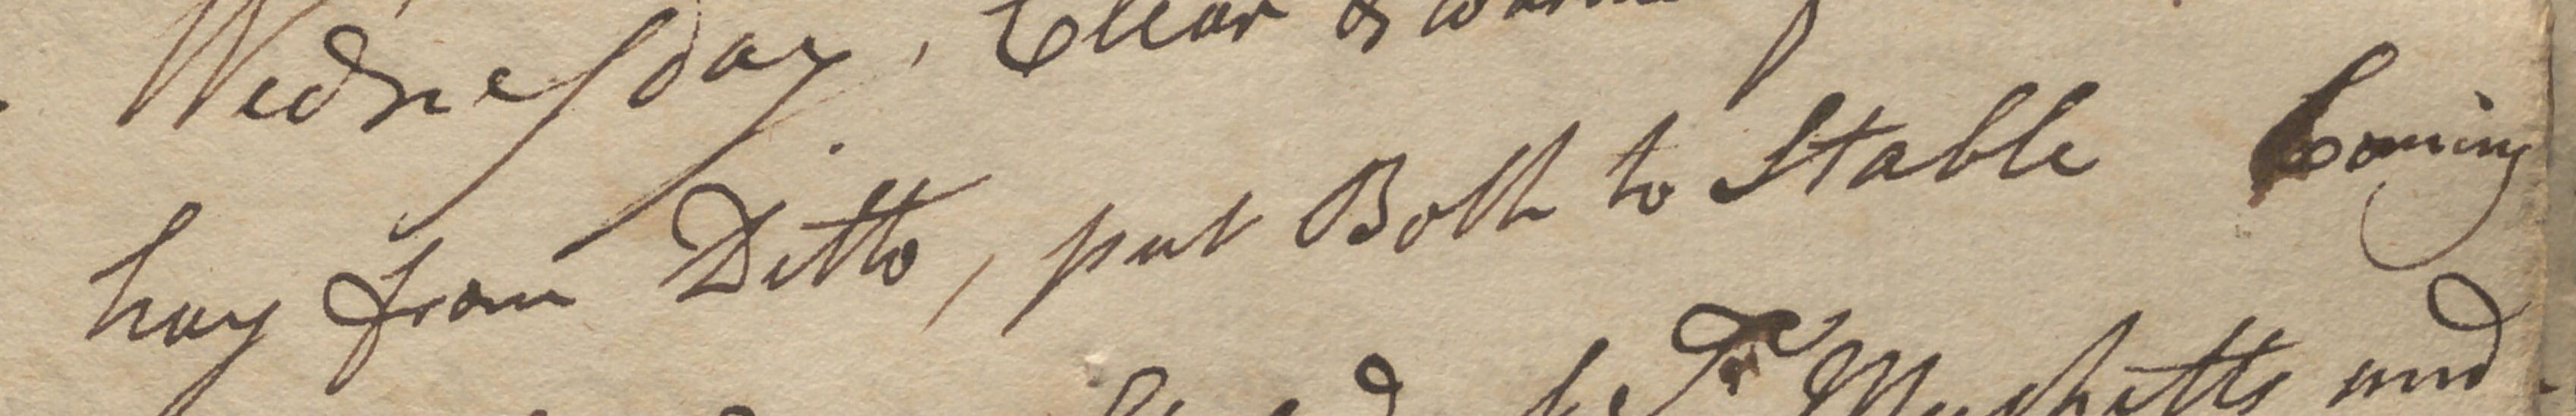hay from Ditto, put Both to Stable Coming
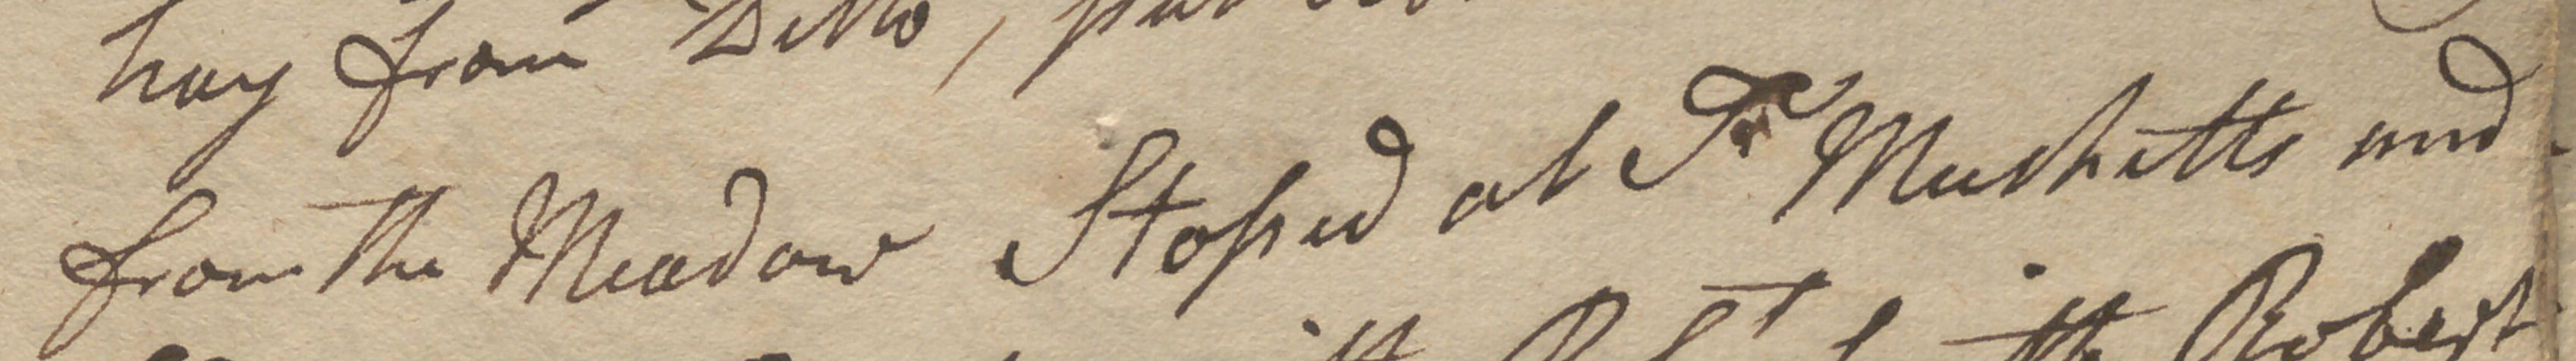from the Meadow, Stoped at T^s. Mushetts and
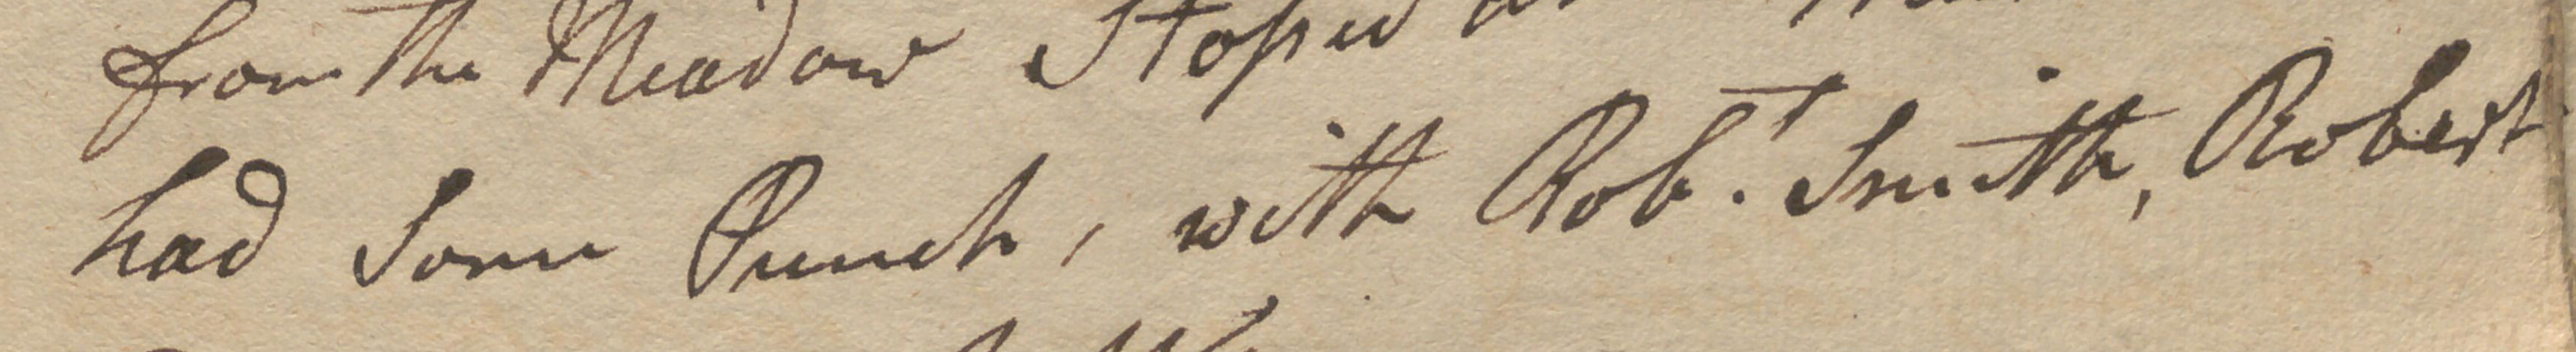had some Punch, with Rob^t. Smith, Robert
